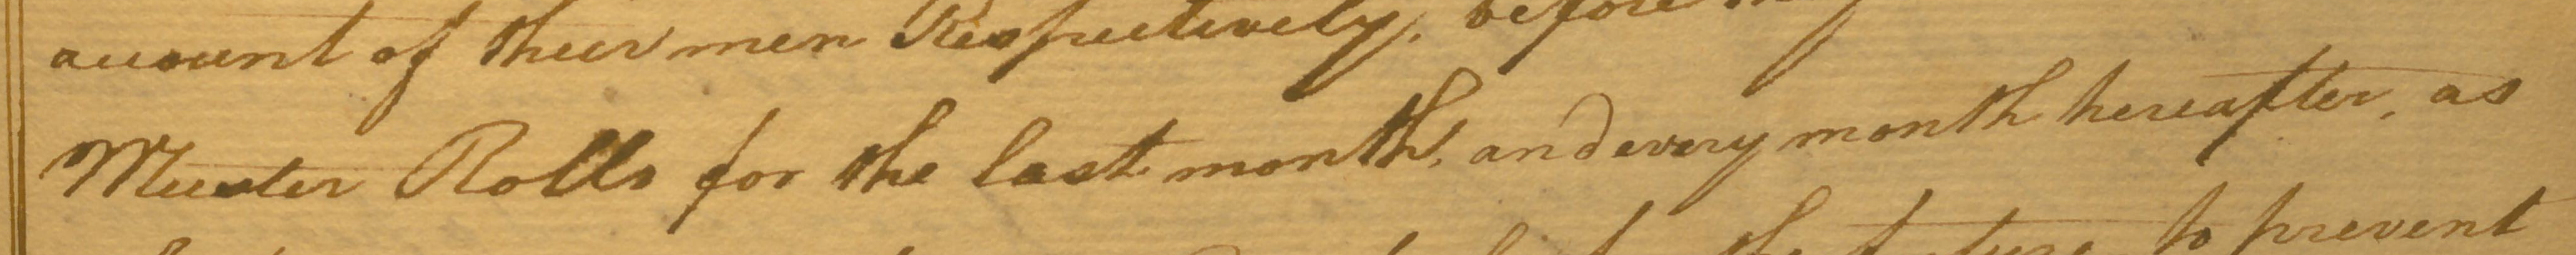Muster Rolls for the last month and every month hereafter, as
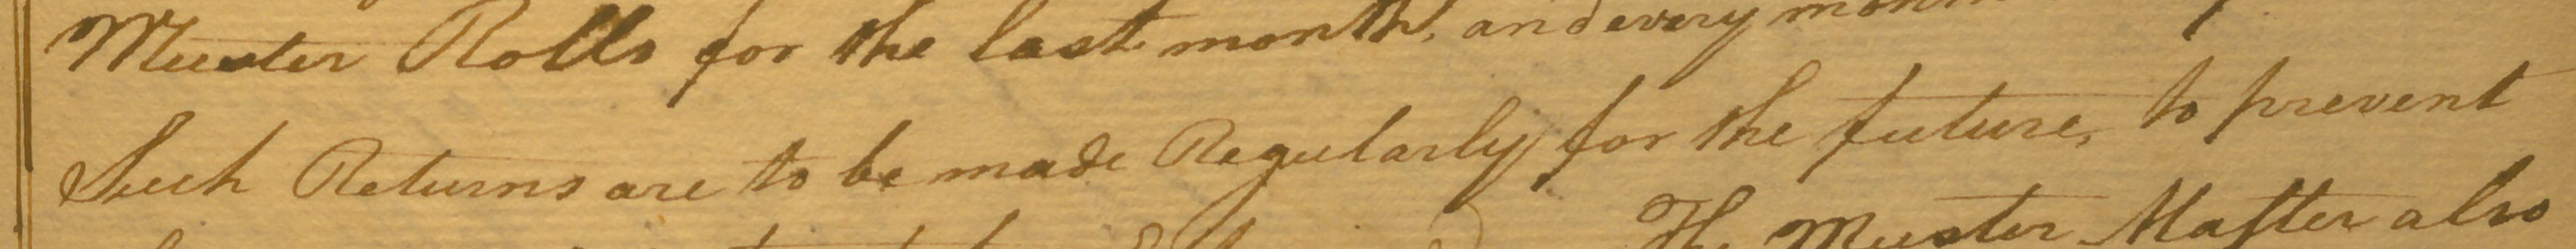Such Returns are to be made Regularly for the future to prevent
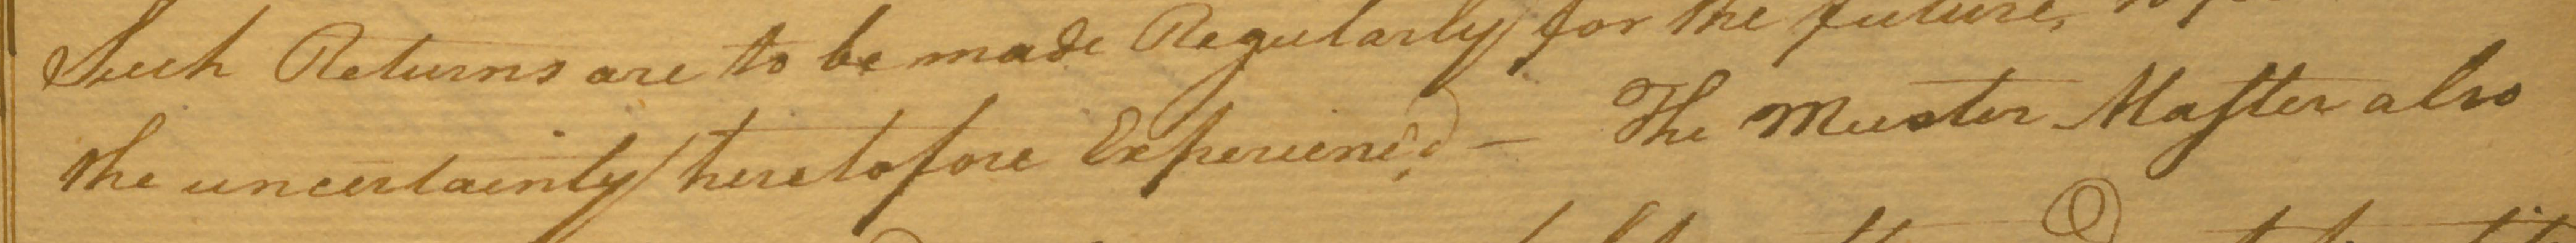the uncertainty heretofore Experienc'd- The Muster Master also
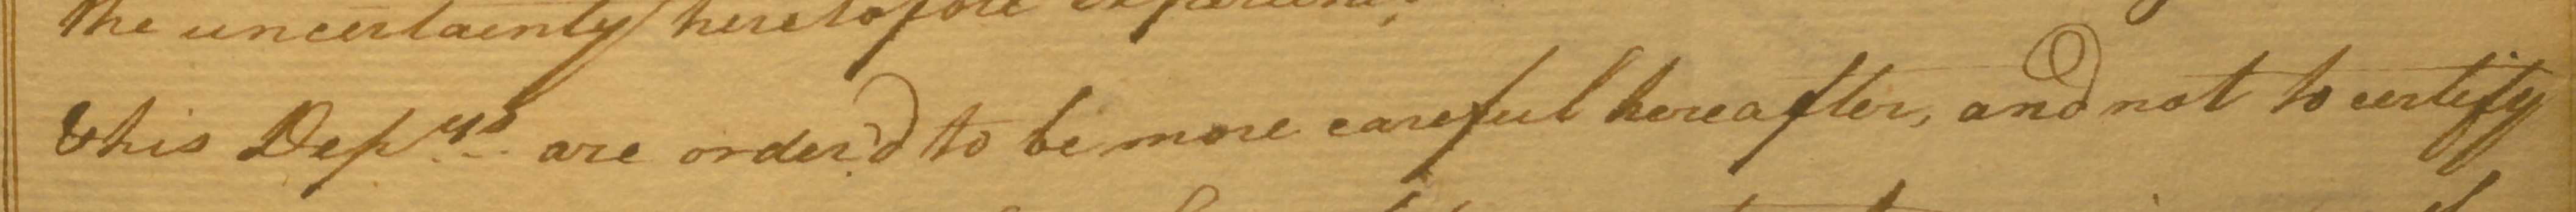& his Dep^ys. are order'd to be more careful hereafter, and not to certify
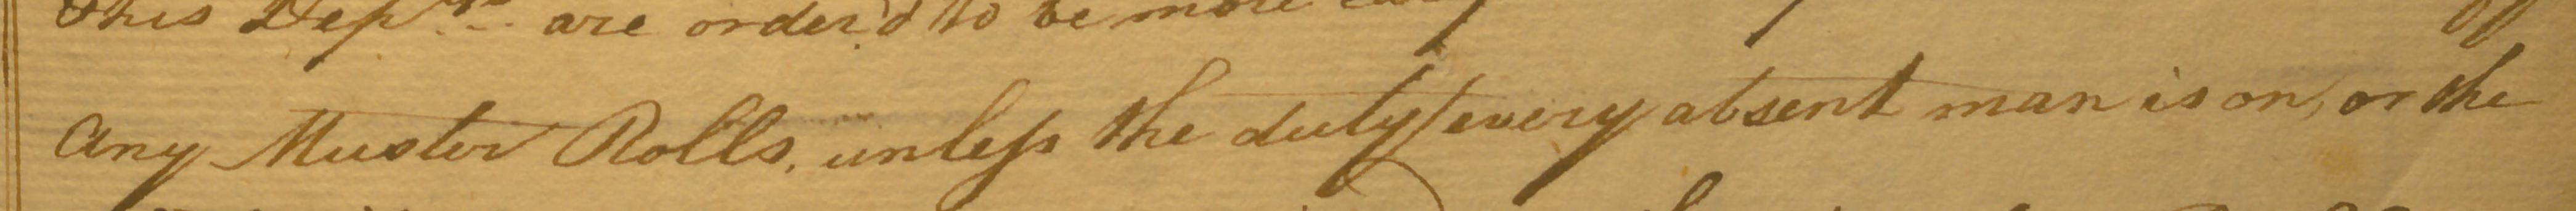Any Muster Rolls unless the duty every absent man is on or the
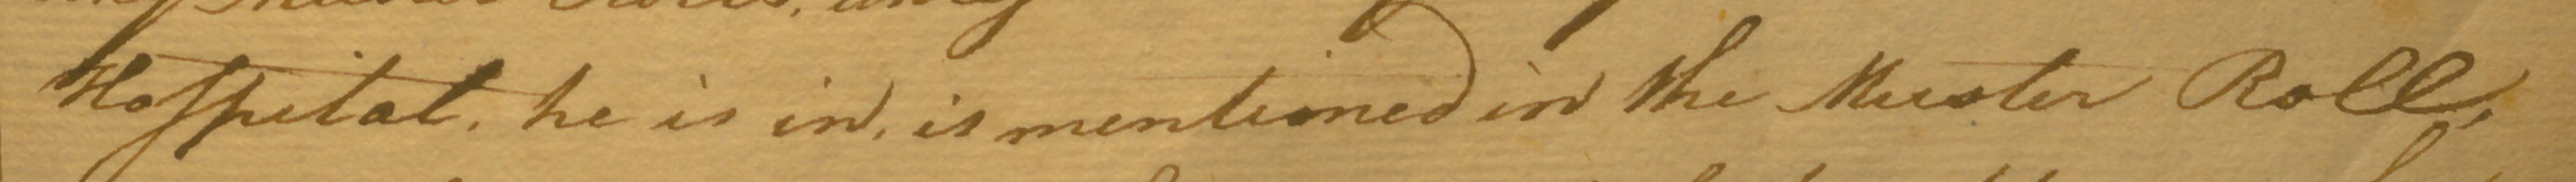Hospital he is in, is mentioned in the Muster Roll.
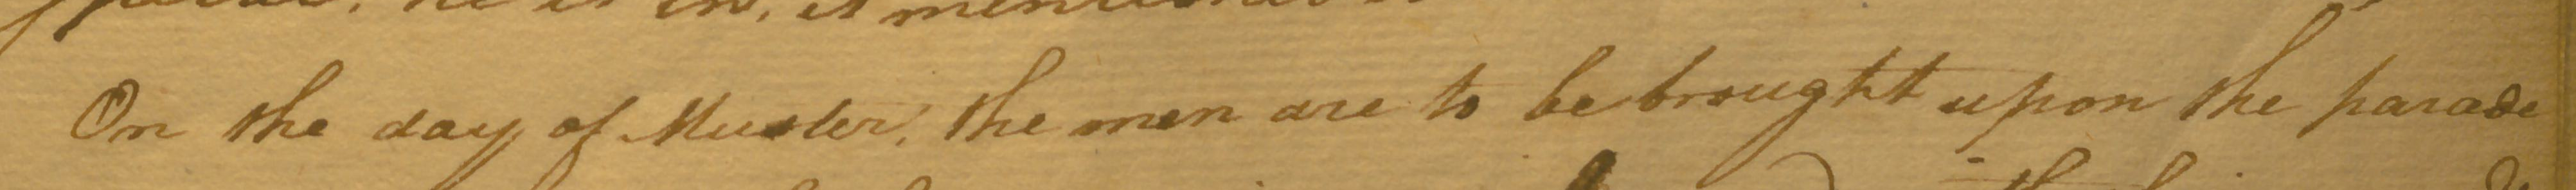On the day of Muster, the men are to be brought upon the parade
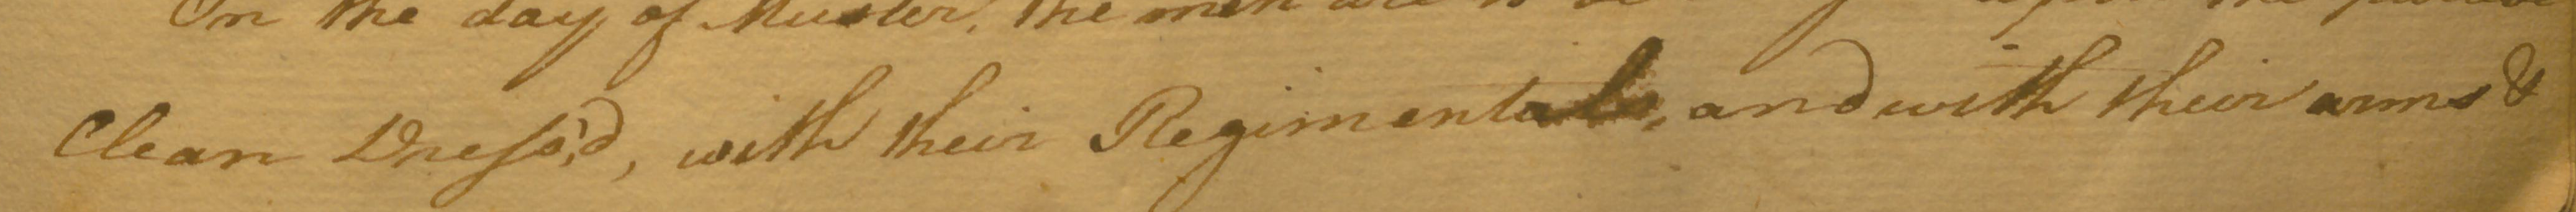clean Dress'd, with their Regimentals and with their arms &
